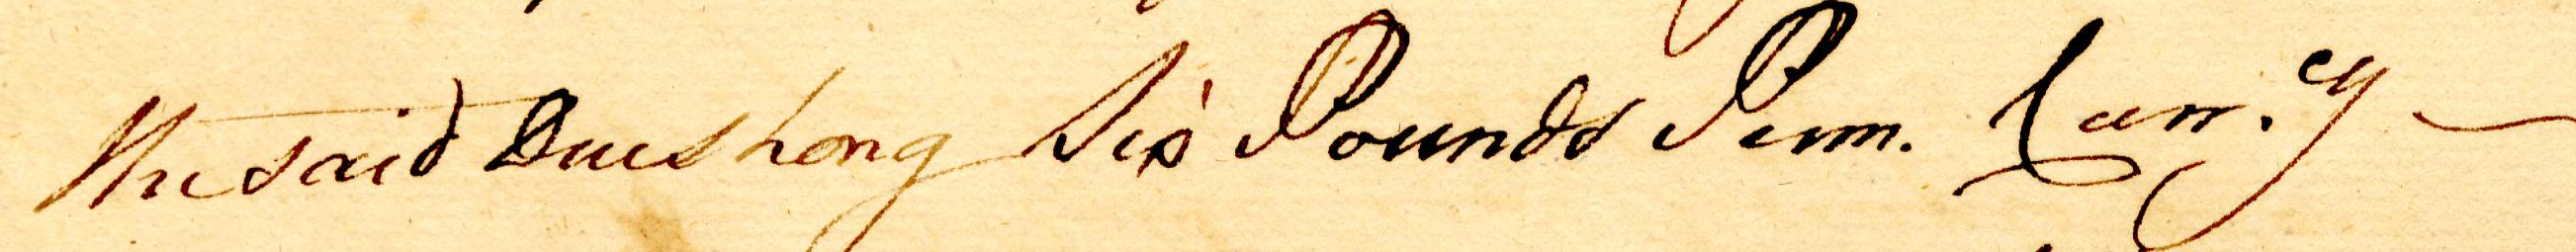the said Dueshing Six Pounds Penn. Curr^cy-
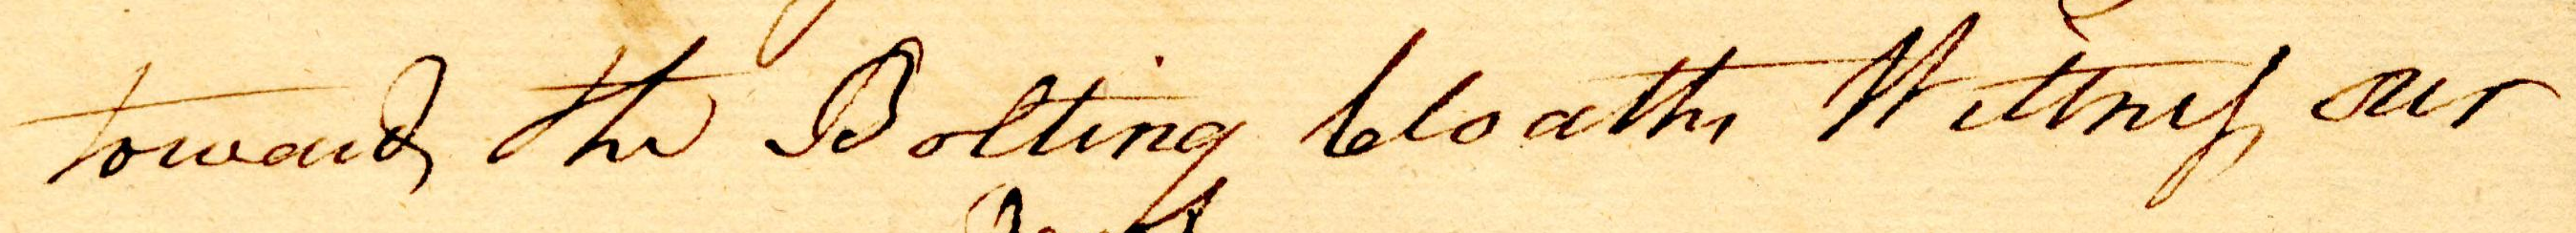toword, the Bolting Cloaths Wittnes, our
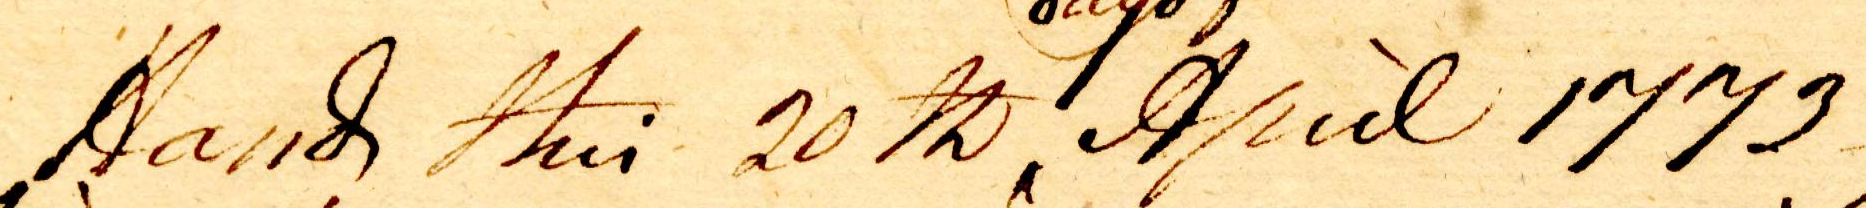Hand this 20^th ^ April 1773
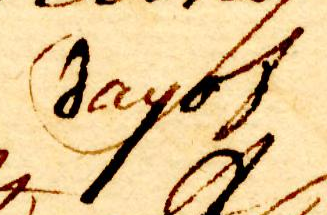day of
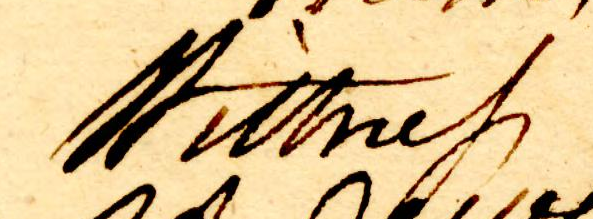Wittnes
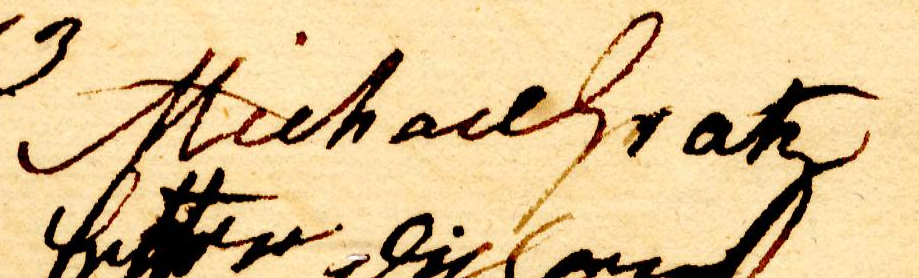Michael Gratz
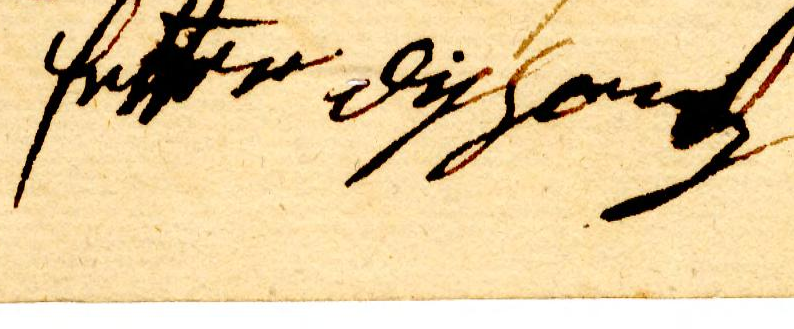Peter Dueshong
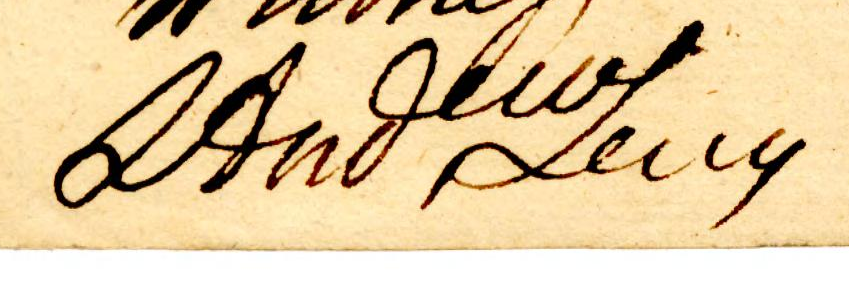And^rew Levy
